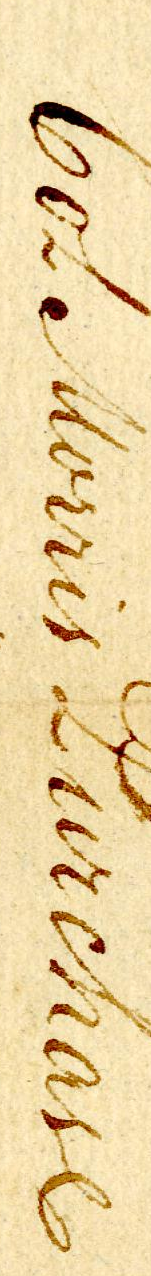Col Morris Purchase
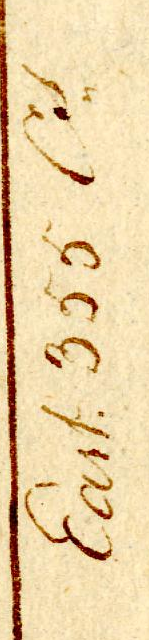East. 355 C^o.
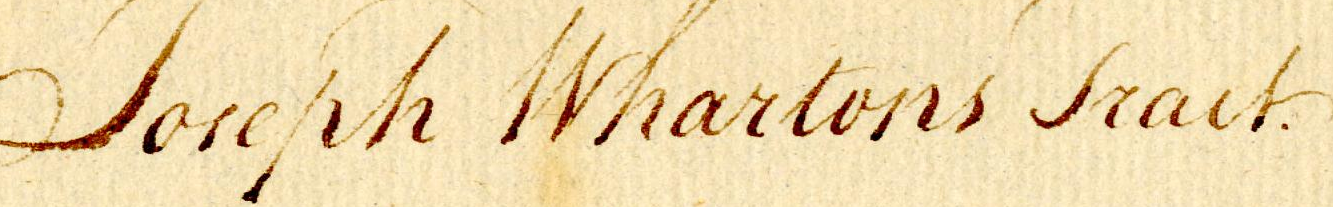Joseph Whartons Tract
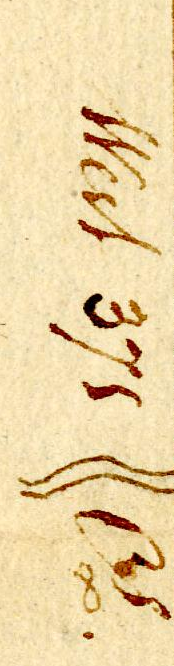West 375 BS
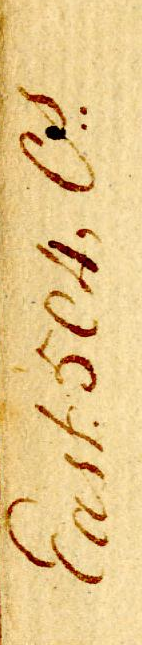East 504: C^s
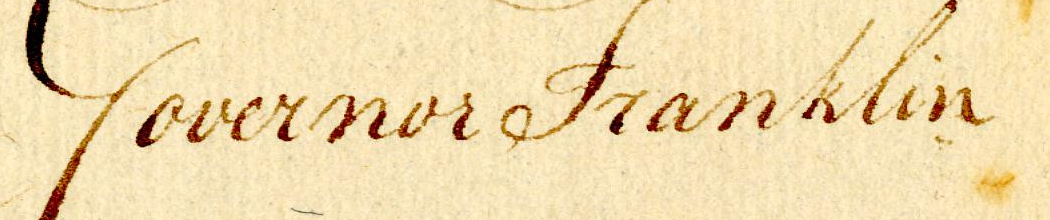Governor Franklin
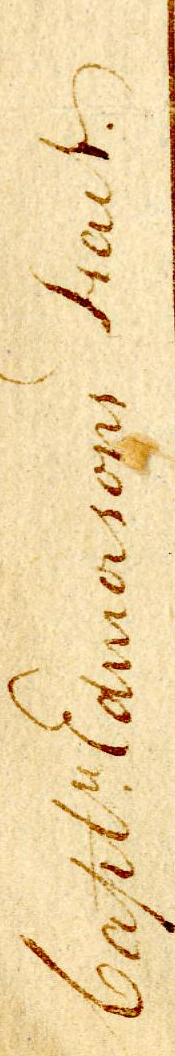Capt^n. Edmonsons Tract.
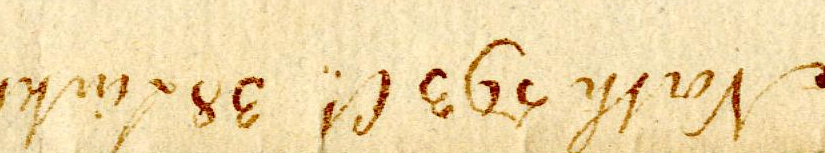North 593 C^r 38 Sliks
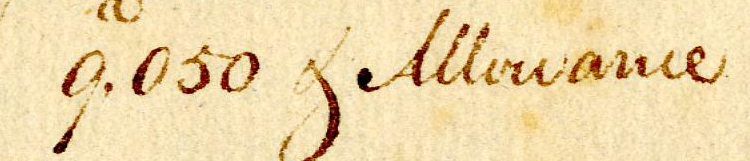9050 Allowance
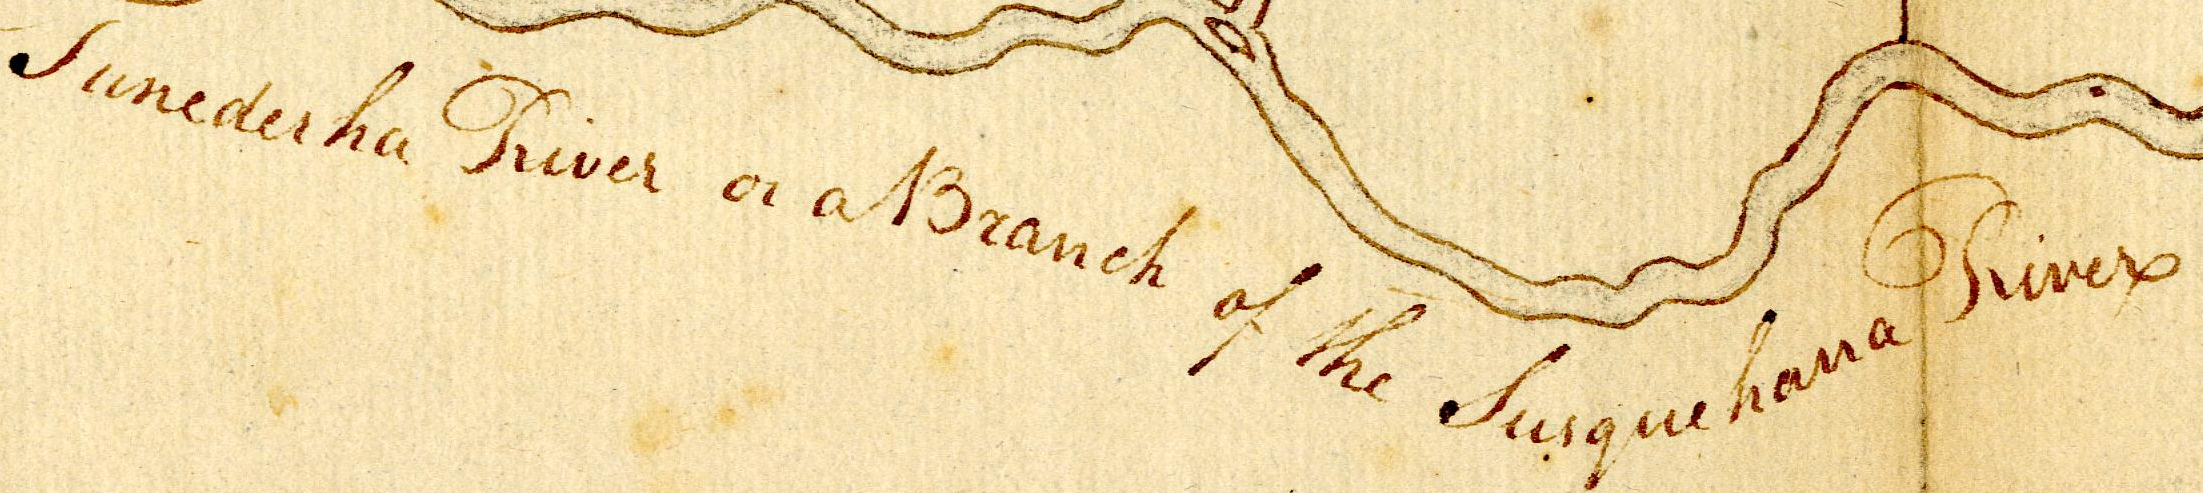Sunedesha River on a Branch of the Susquahana River
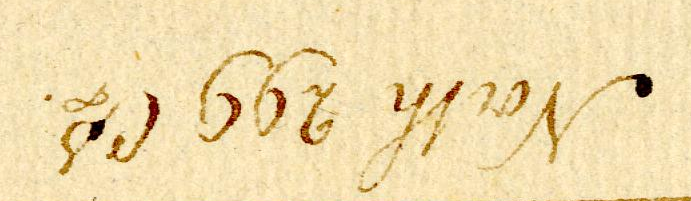North 299 C^s
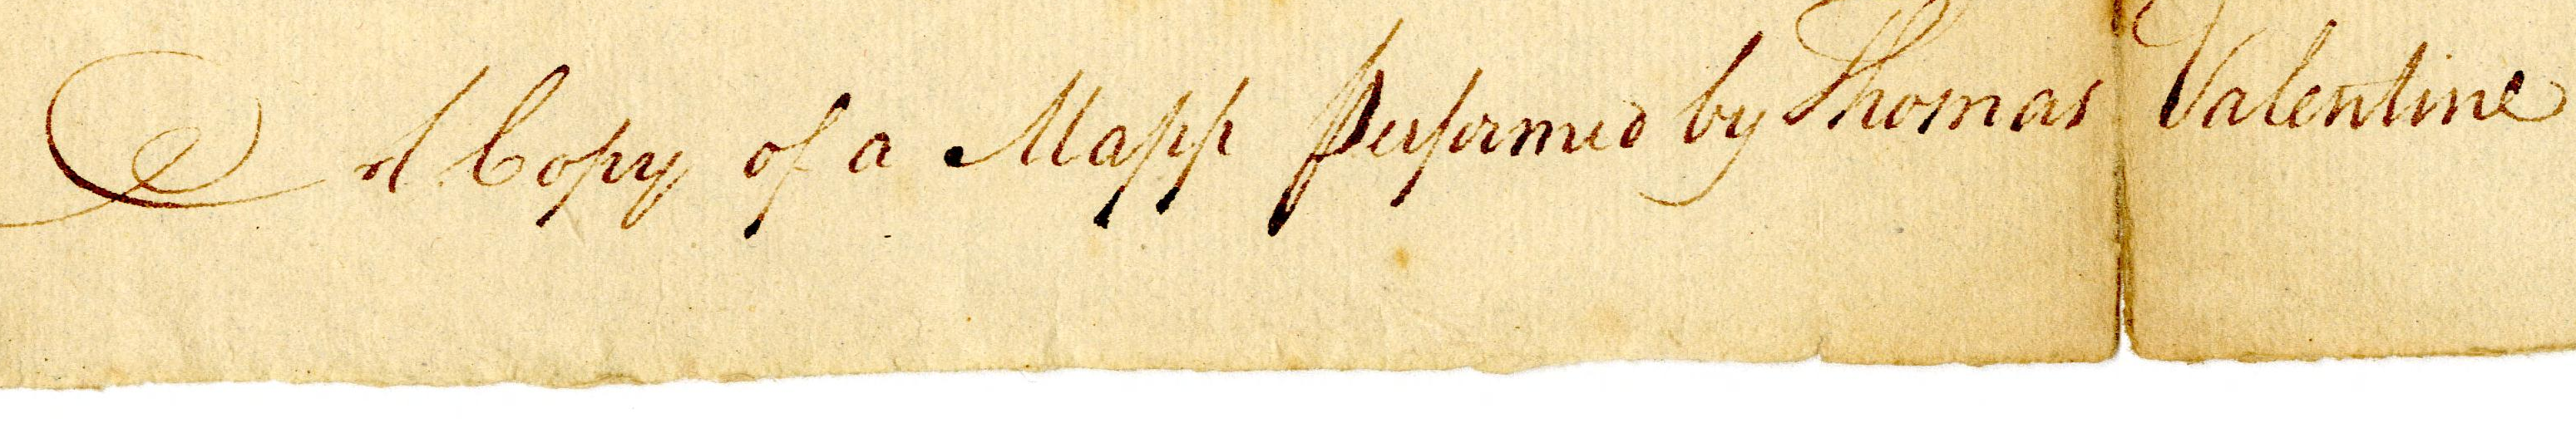A Copy of a Mapp Performed by Thomas Valentine
